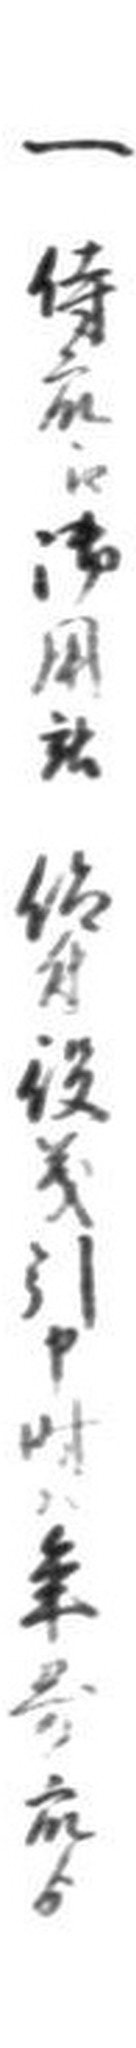一侍衆江御用被仰付役義引申時は年寄衆ゟ
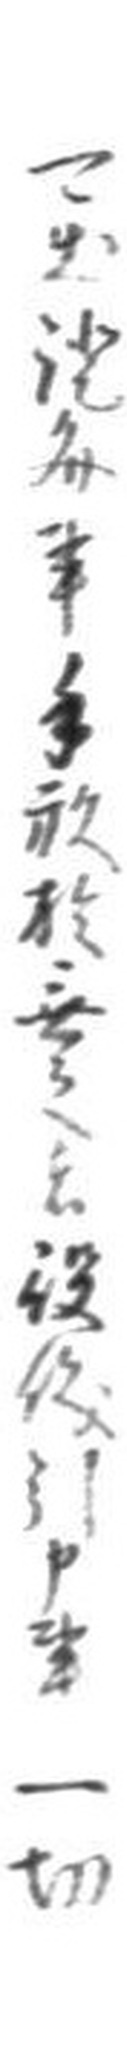可出證文事手形於無之は役儀引申事一切
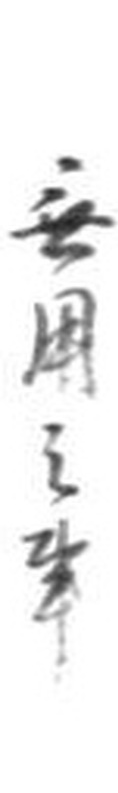無用之事
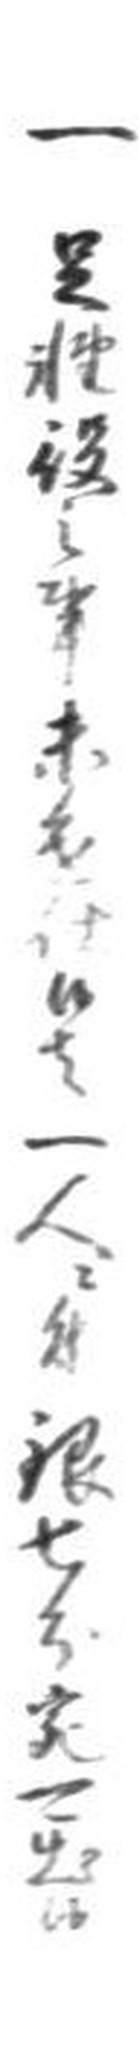一足軽役之事未遣任候は一人ニ付銀七分宛可出候
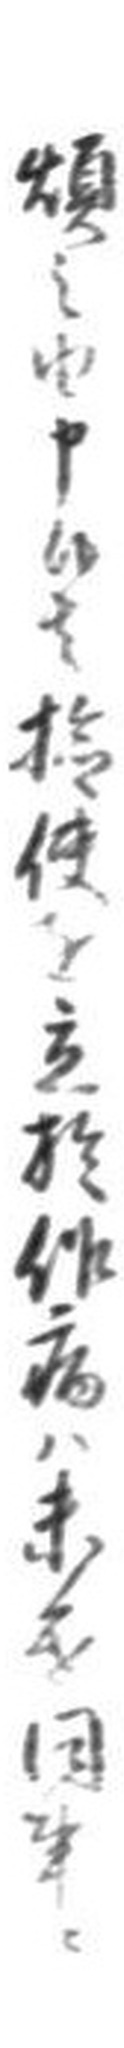煩之由申候は検使を立於詐病は未遣同事ニ
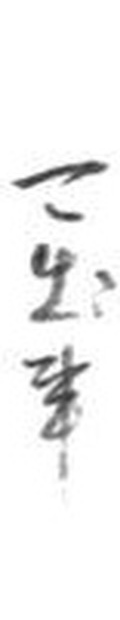可出事

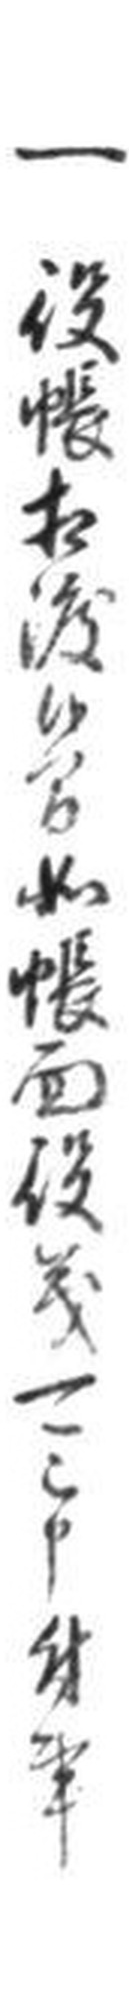一役帳相渡候間如帳面役義可被申付事
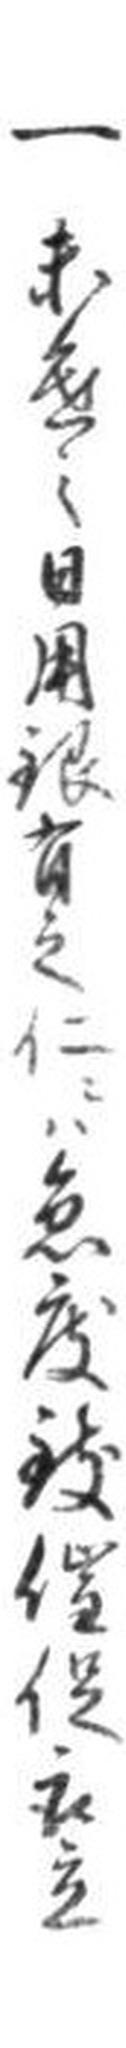一未遣之日用銀有之仁ニは急度致催促取立
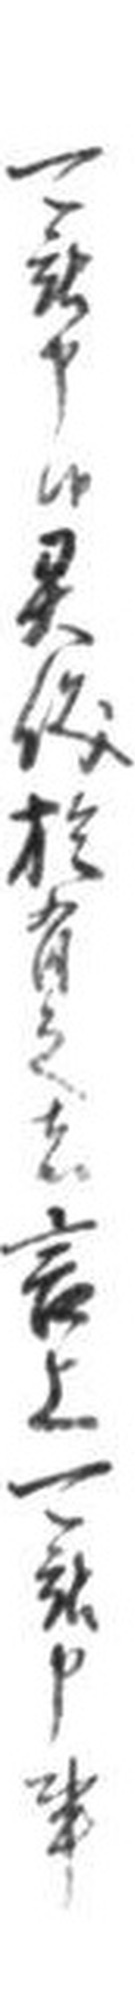可被申候異議於有之は言上可被申事
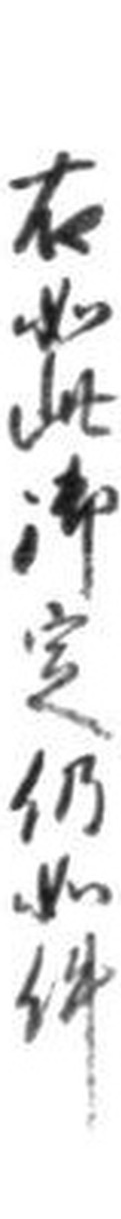右如此御定仍如件
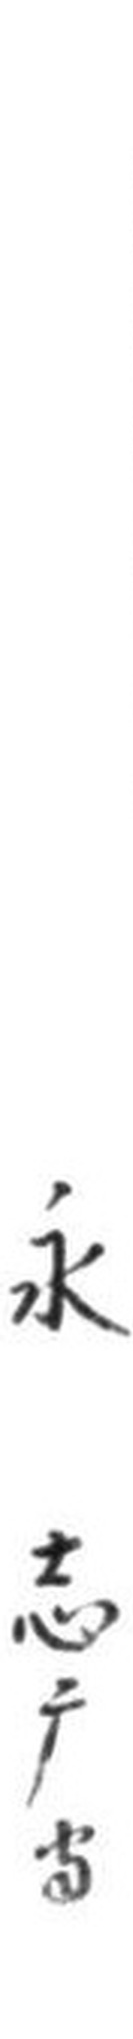永志摩守
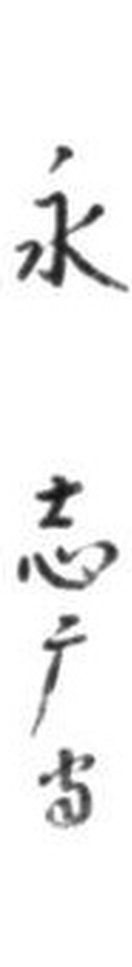永志摩守
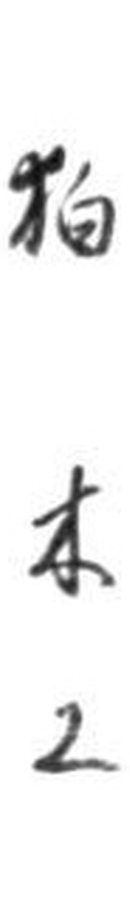狛木工
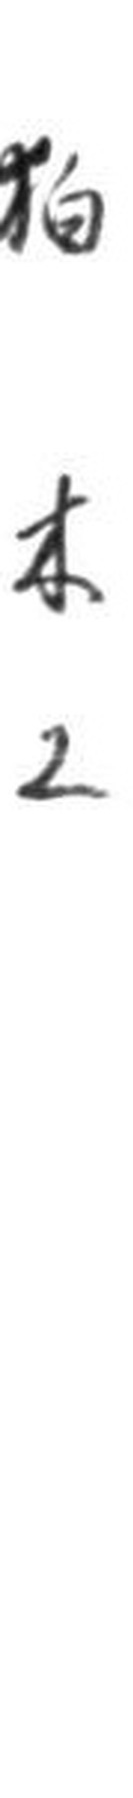狛木工
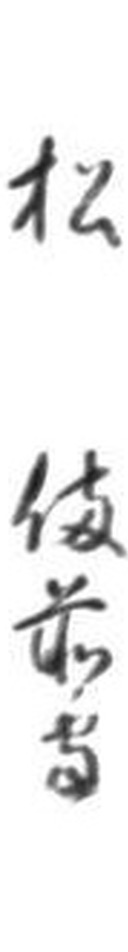松備前守
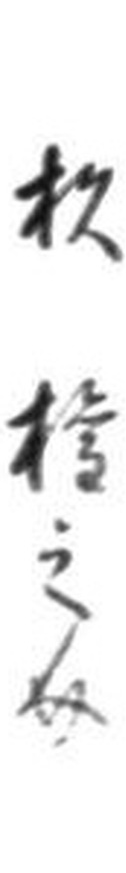杉権之介
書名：家譜 三 忠昌公 従慶長八年到寛永六年
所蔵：福井県文書館 Fukui Prefectural Archives
